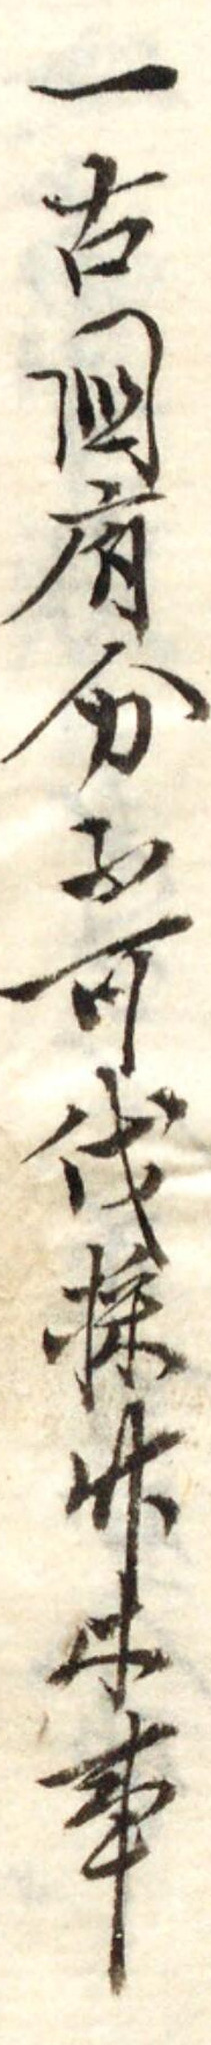一古国府分ふ可伐採竹事
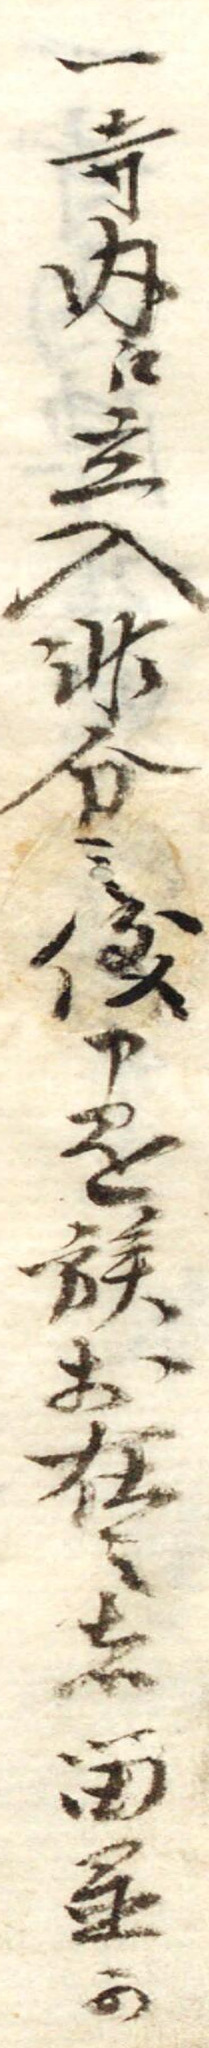一寺内江立入非分之儀申懸族お在之者留置可
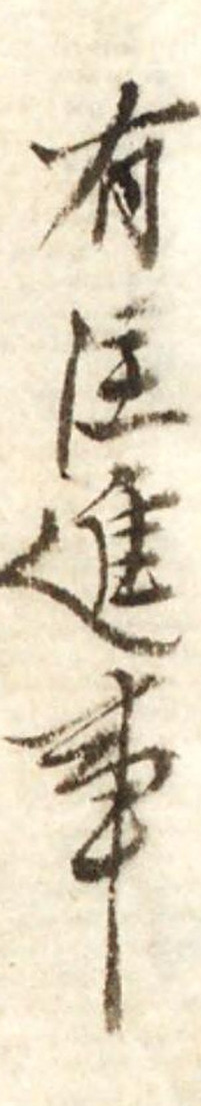有注進事
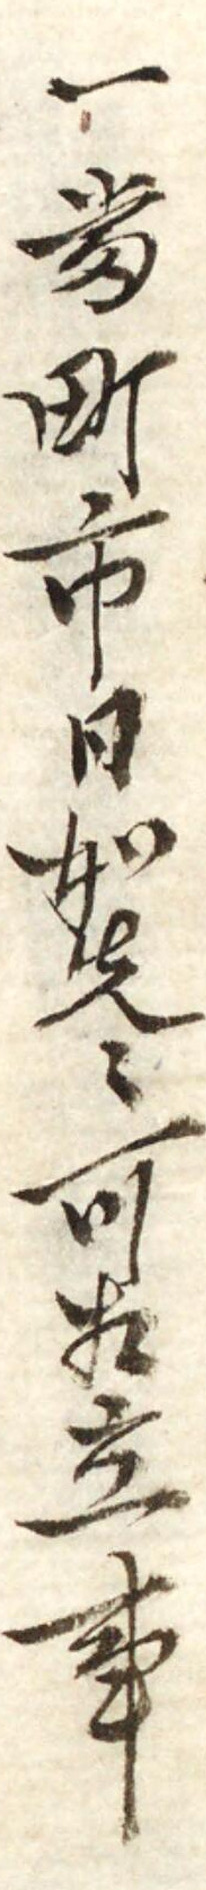一当町市日如先々可相立事
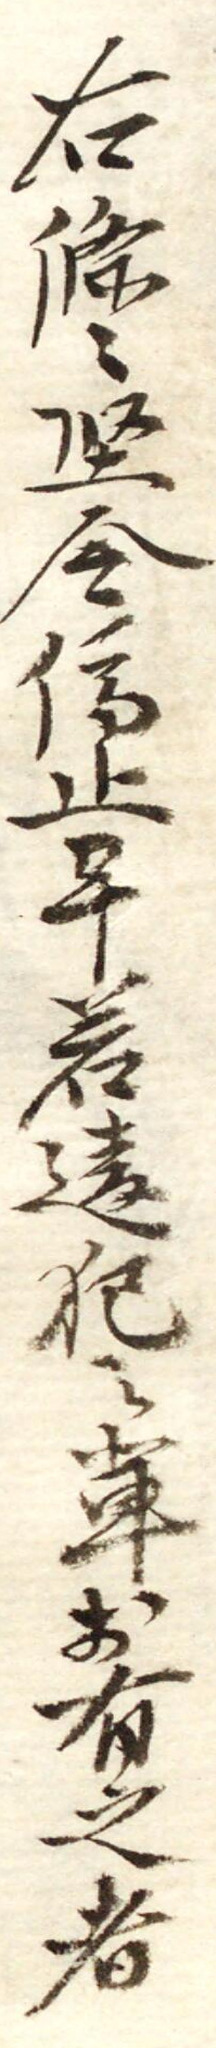右條々堅令停止畢若違犯之輩お有之者
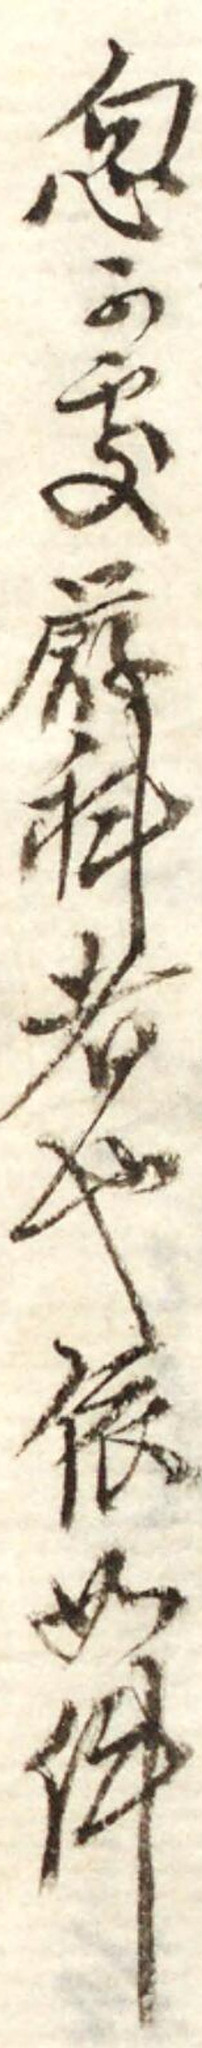忽可處厳科者也依如件
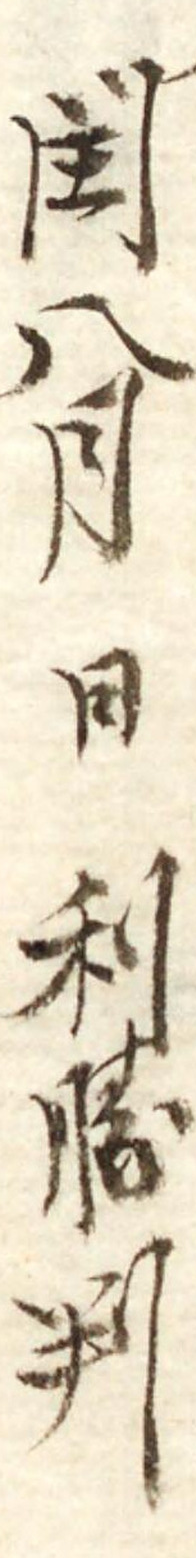閏八月日利勝判
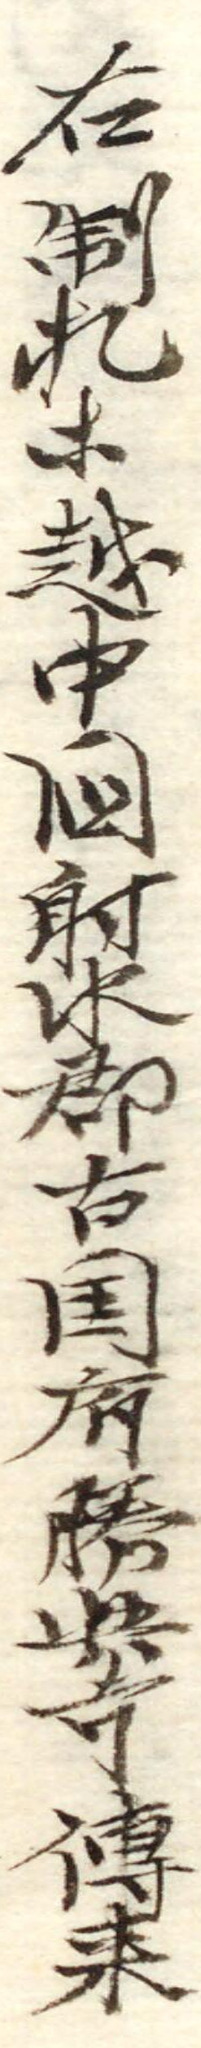右制札等越中国射水郡古国府勝興寺伝来
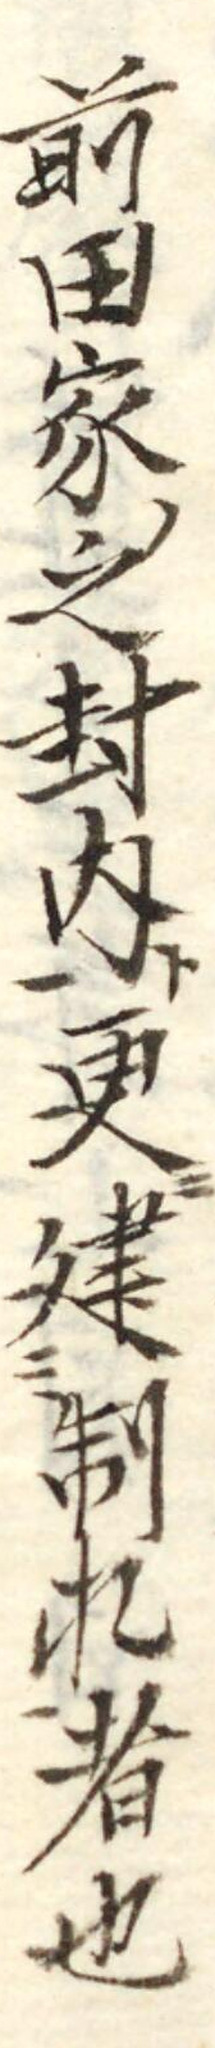前田家之封内と更に建制札者也
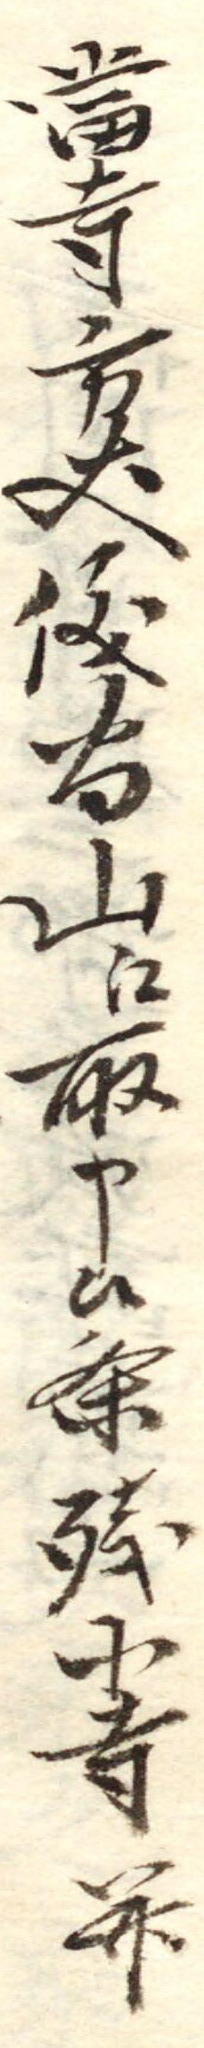当寺方丈儀守山江取申候条残小寺幷
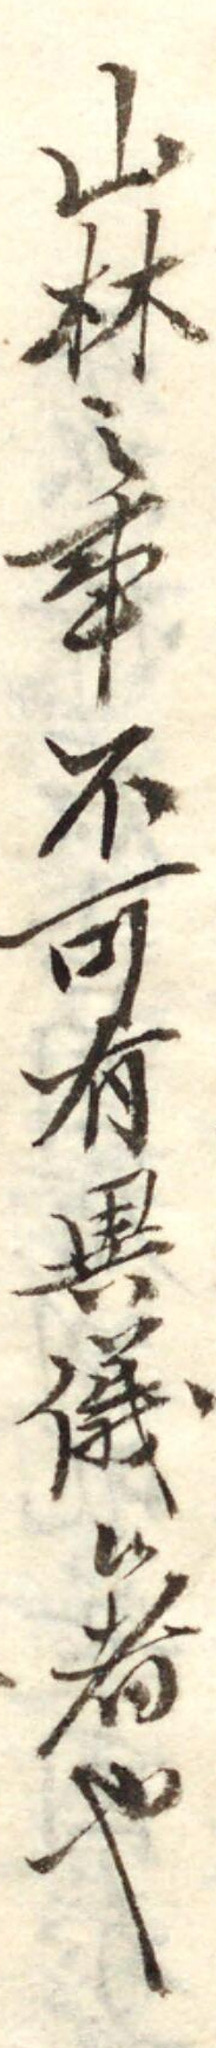山林之事不可有異儀候者也
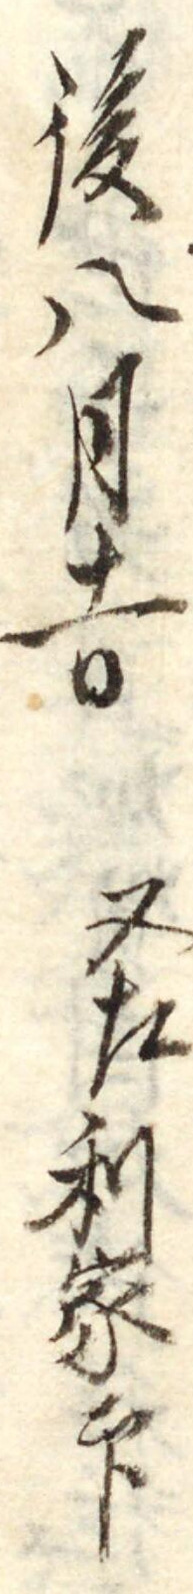後八月十一日又左利家印
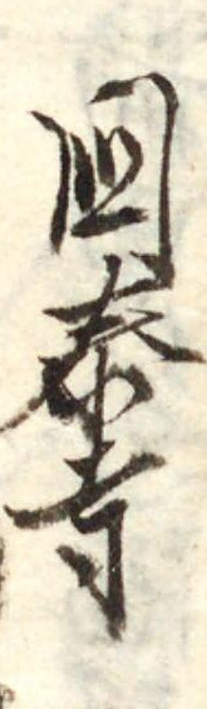国泰寺
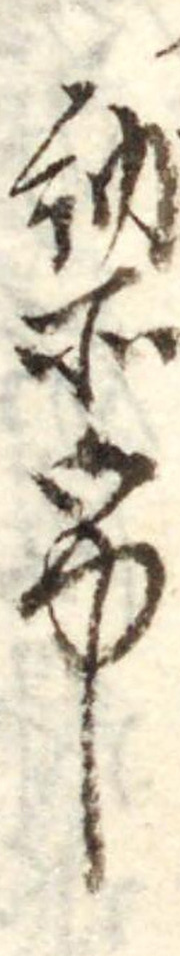納所御中
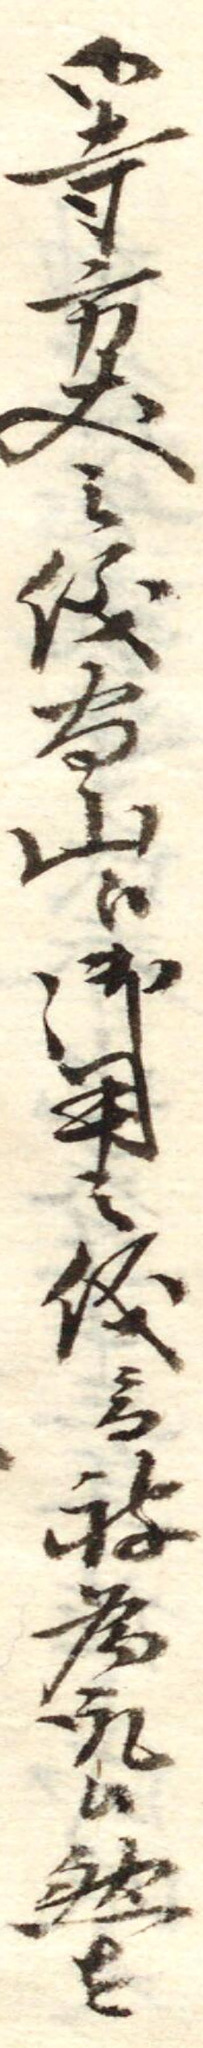御寺方丈之儀守山江御用之儀に而被為取候然者
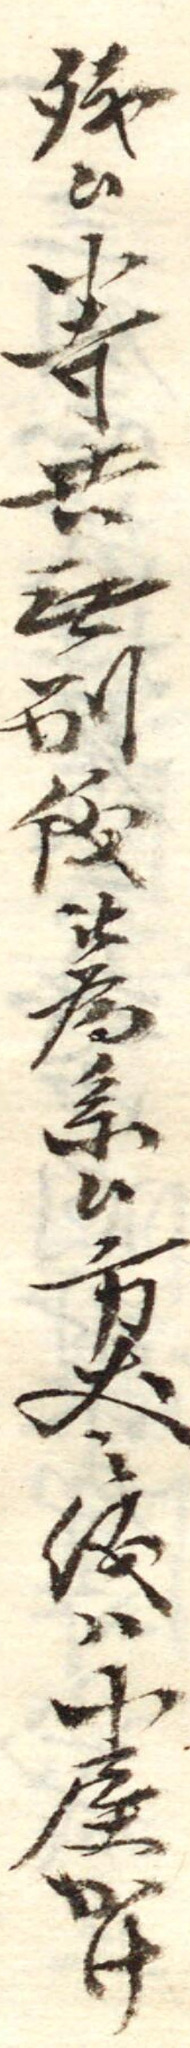残候小寺共無別儀被為参候方丈之儀は小屋かけ
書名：前田家封国証書集録
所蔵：Ishikawa Prefectural Library
